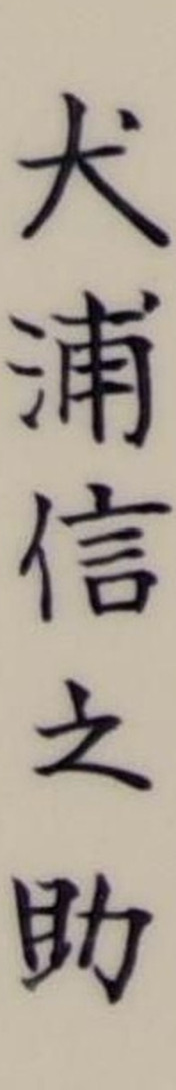犬浦信之助
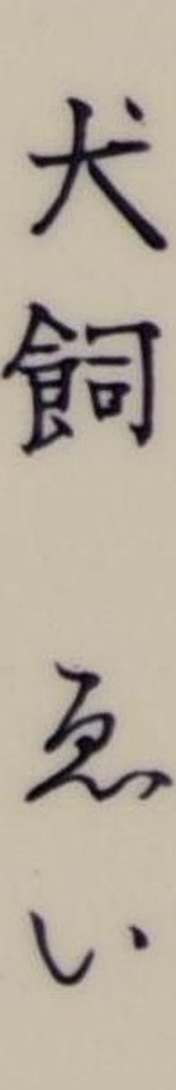犬飼ゑい
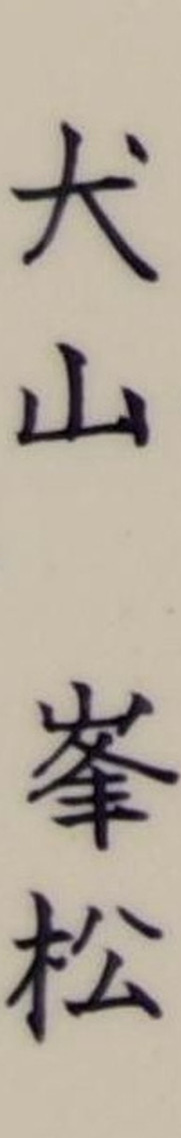犬山峯松
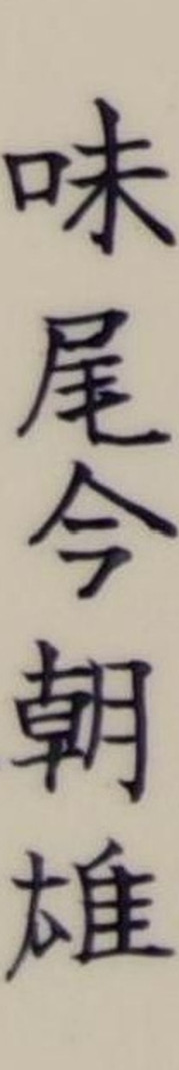味尾今朝雄

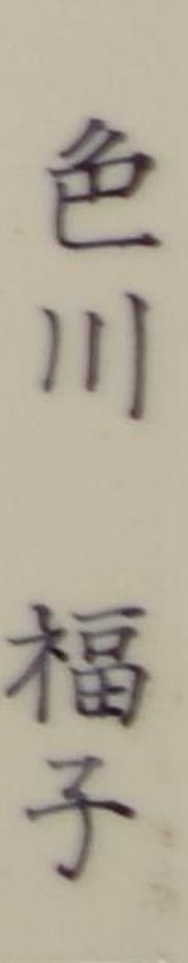色川福子
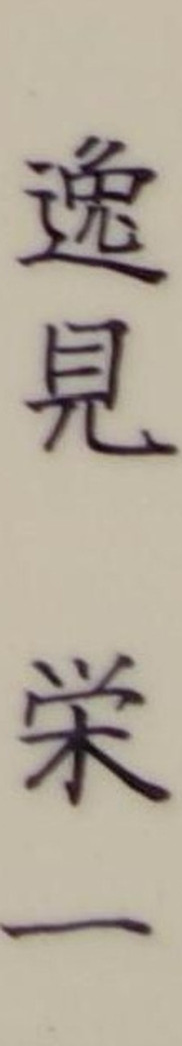逸見栄一
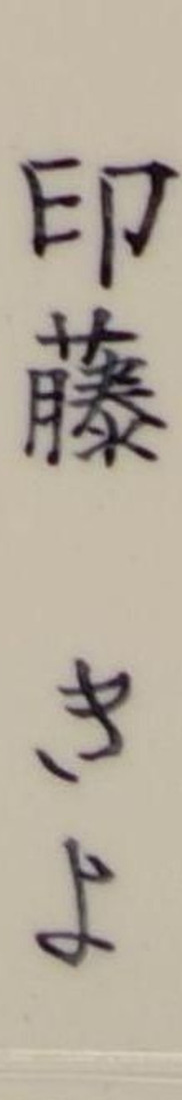印藤きよ
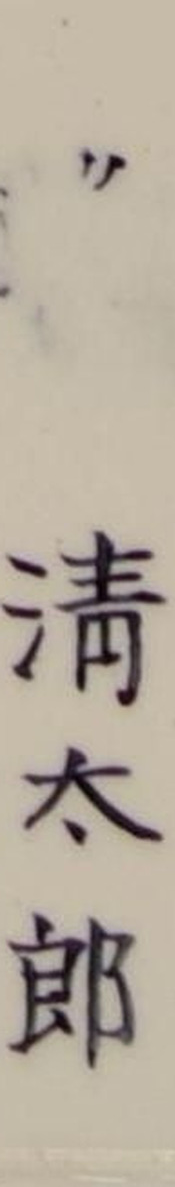清太郎
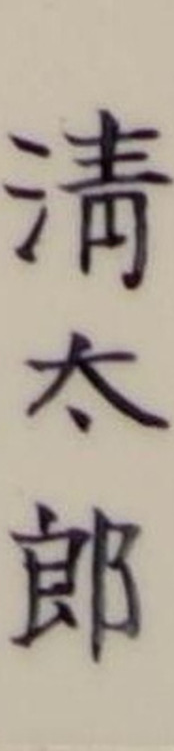清太郎
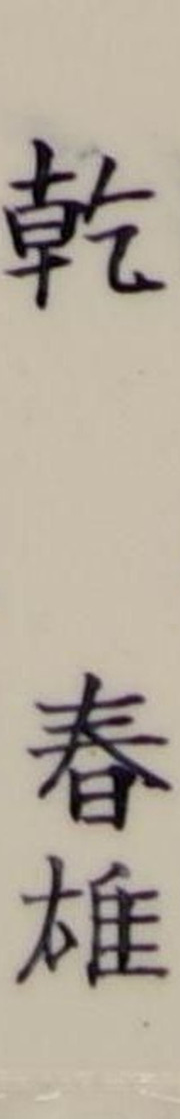乾春雄
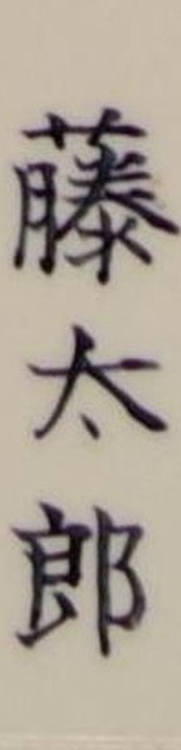藤太郎
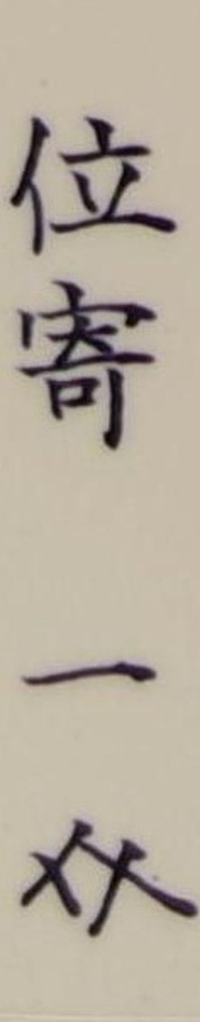位寄一介
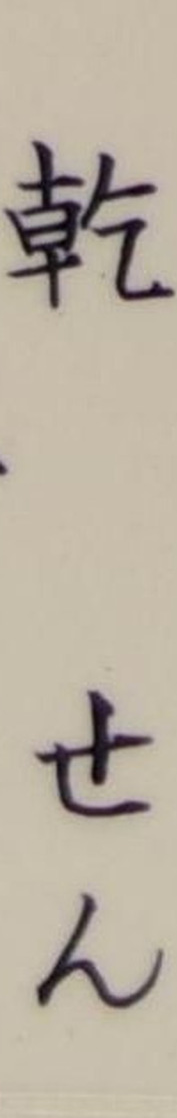乾せん
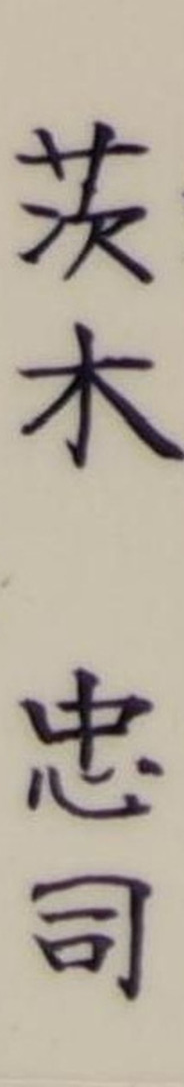茨木忠司
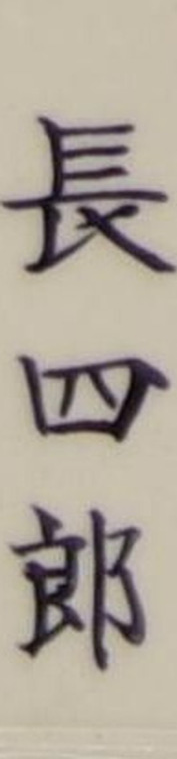長四郎
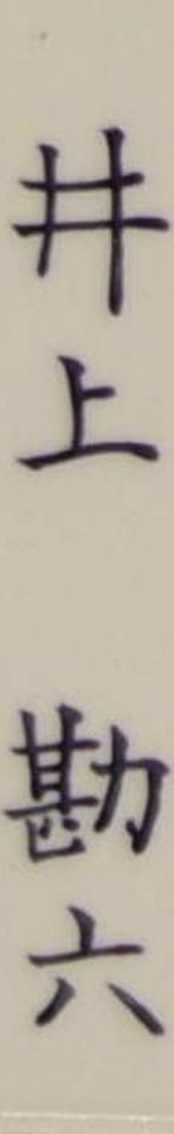井上勘六
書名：M~S
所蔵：高野山金剛峯寺
